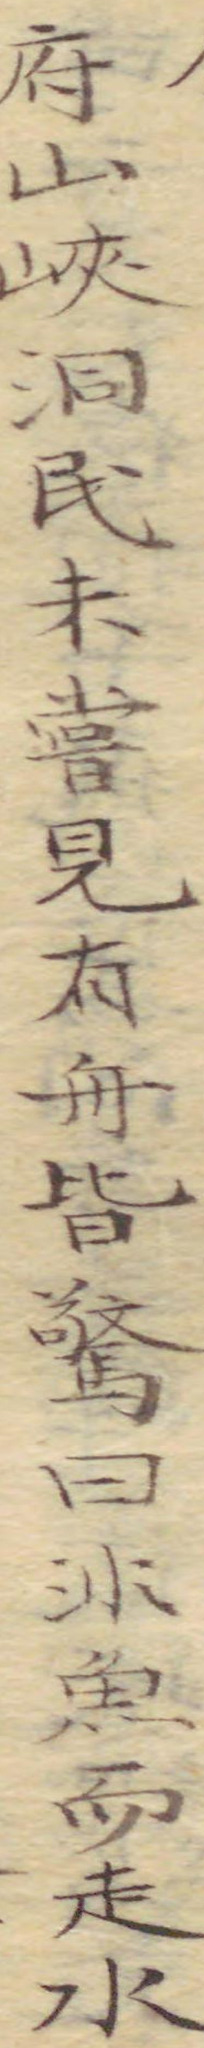府山峡洞民未嘗見有舟皆驚曰非魚而走水
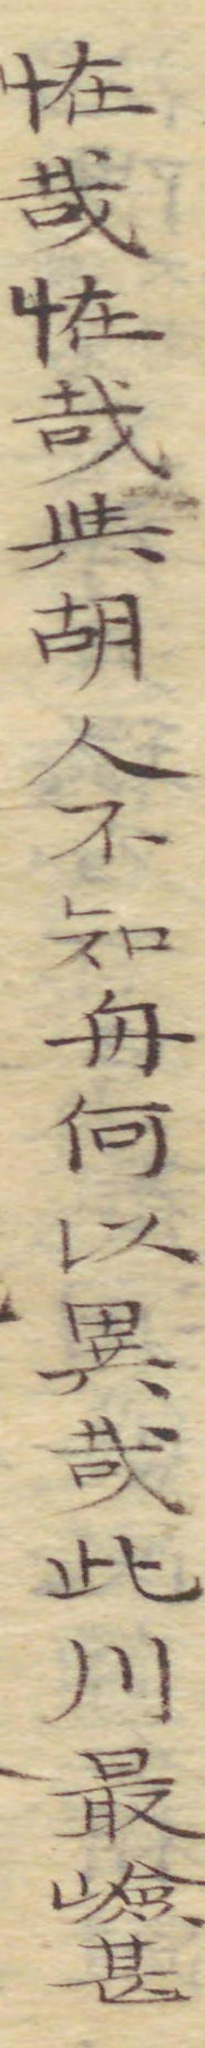恠哉恠哉与胡人不知舟何以異哉此川最嶮甚
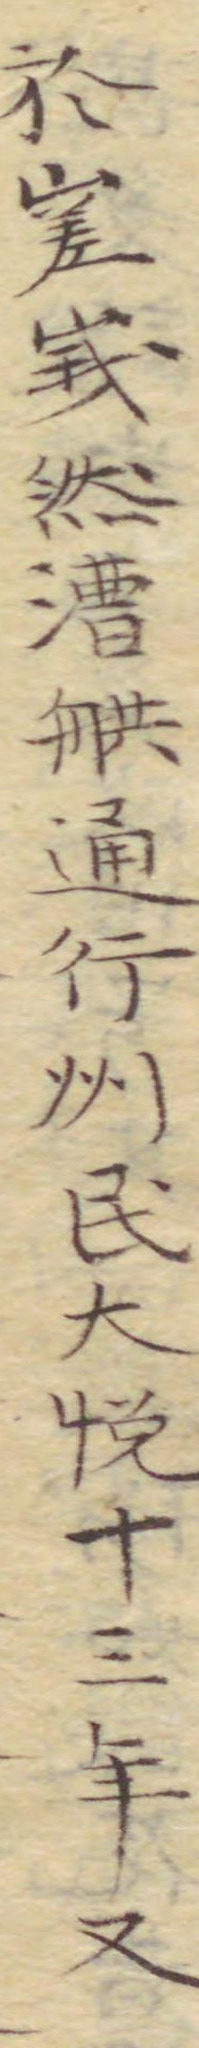於嵯峨然漕舼通行州民大悦十三年又
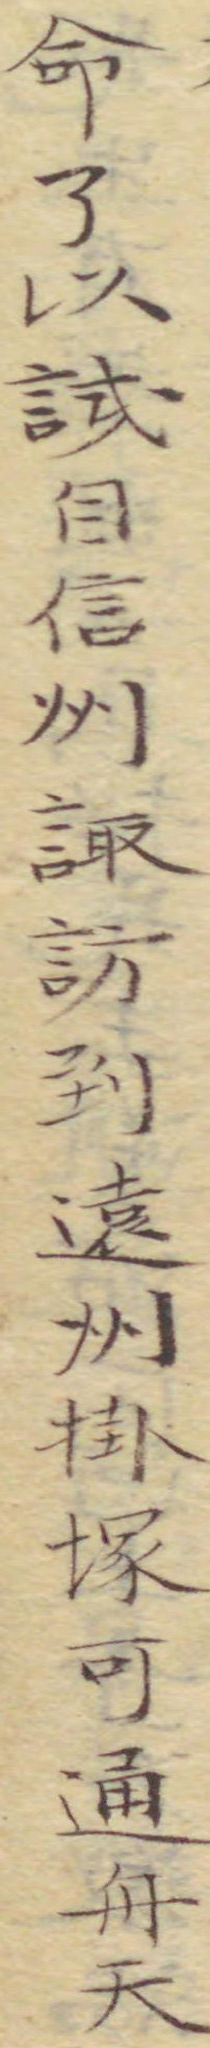命了以試自信州諏訪到遠州掛塚可通舟天
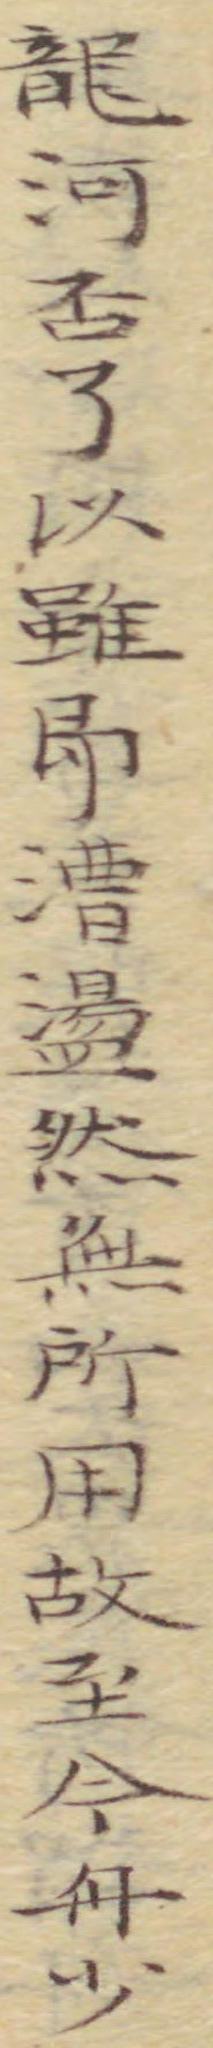龍河否了以雖即漕蘯然無処用故至今舟少
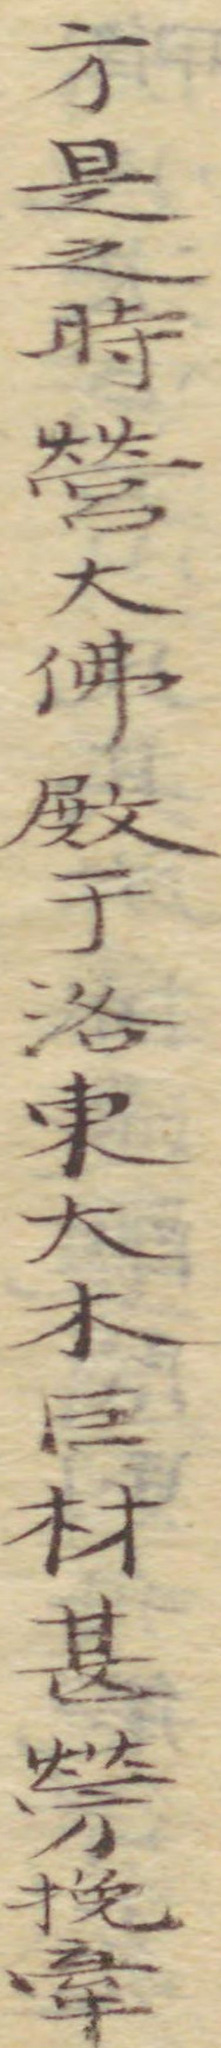方是之時営大仏殿于洛東大木巨材甚労挽牽
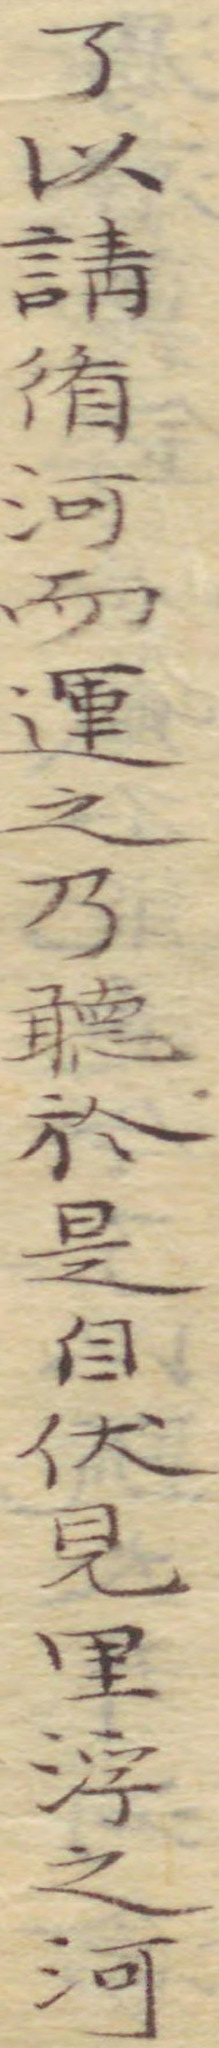了以請循河而運之乃聴於是自伏見里浮之河
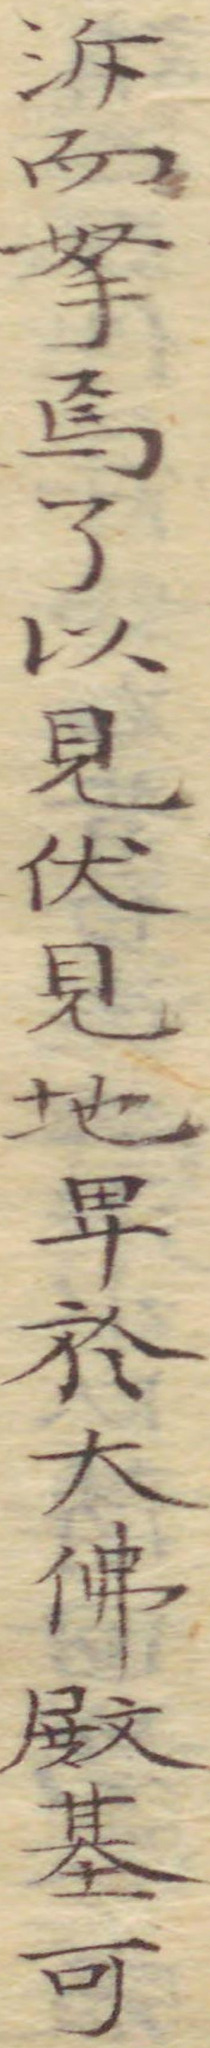泝而拏焉了以見伏見地卑於大仏殿基可
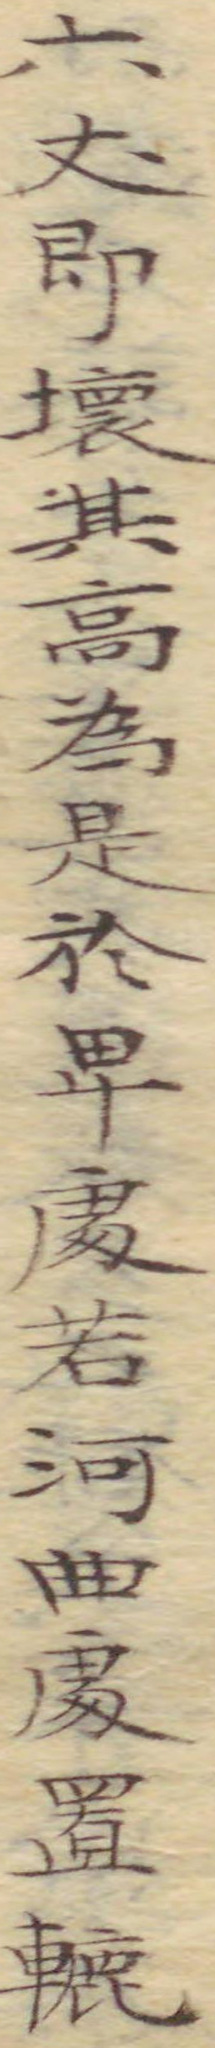六丈即壊其高為是於卑処若河曲処置轆
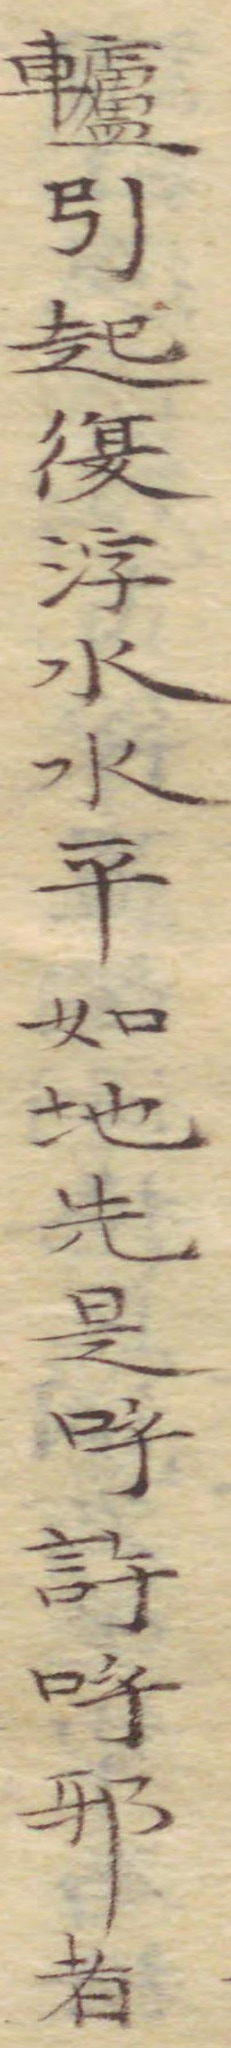轤引起復浮水水平如地先是呼許呼邪者
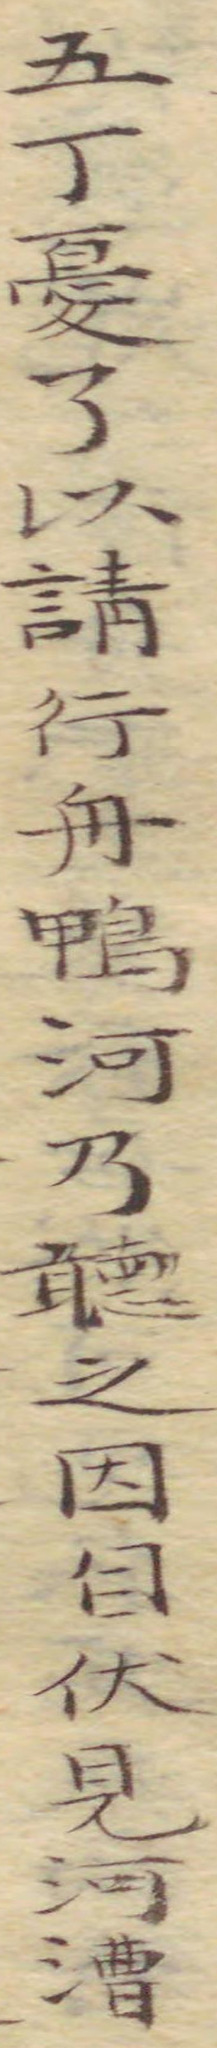五丁憂了以請行舟鴨河乃聴之因自伏見河漕
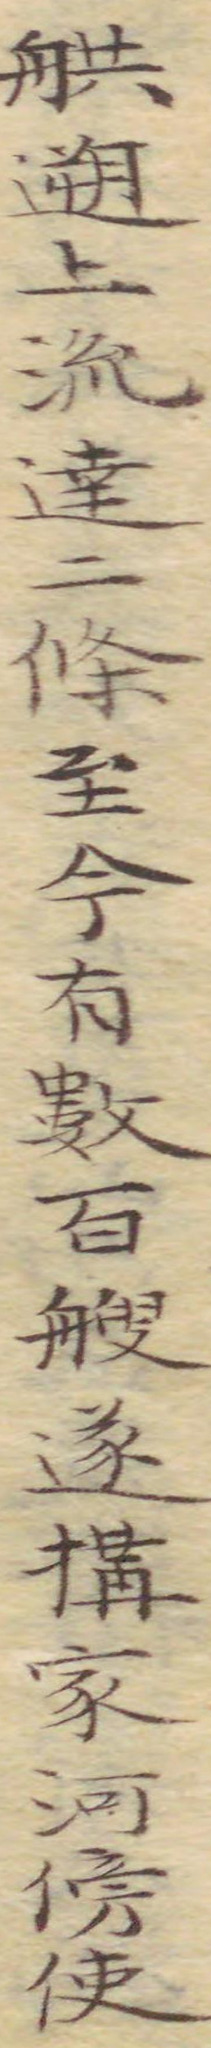舼遡上流達二條至今有数百艘遂構家河傍使
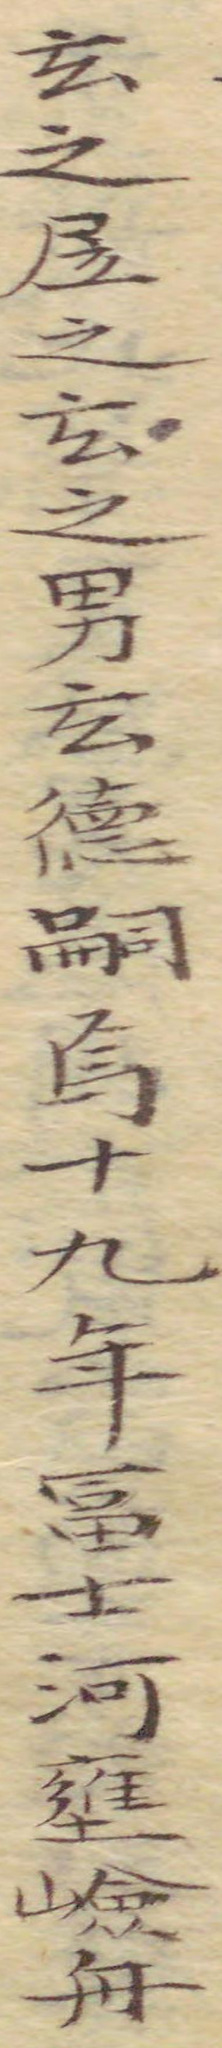玄之㞐之玄之男玄徳嗣焉十九年冨士河壅嶮舟
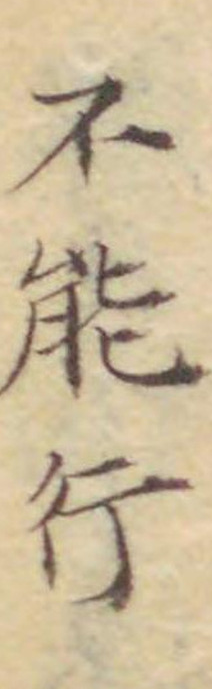不能行
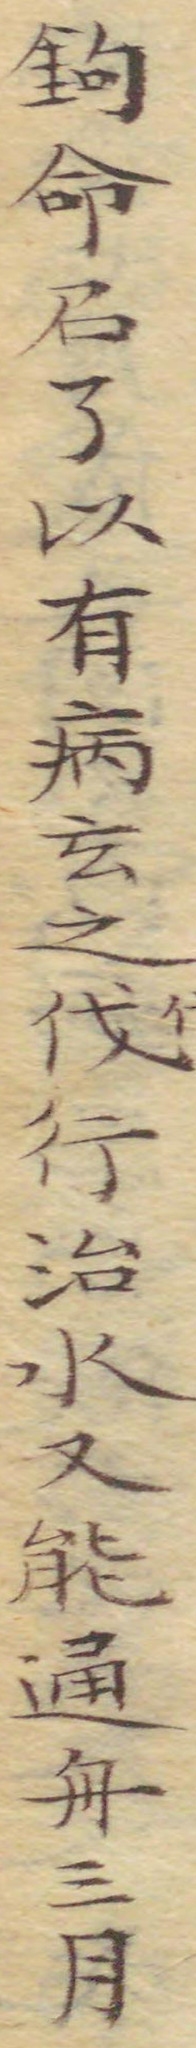鉤命召了以有病玄之伐行治水又能通舟三月

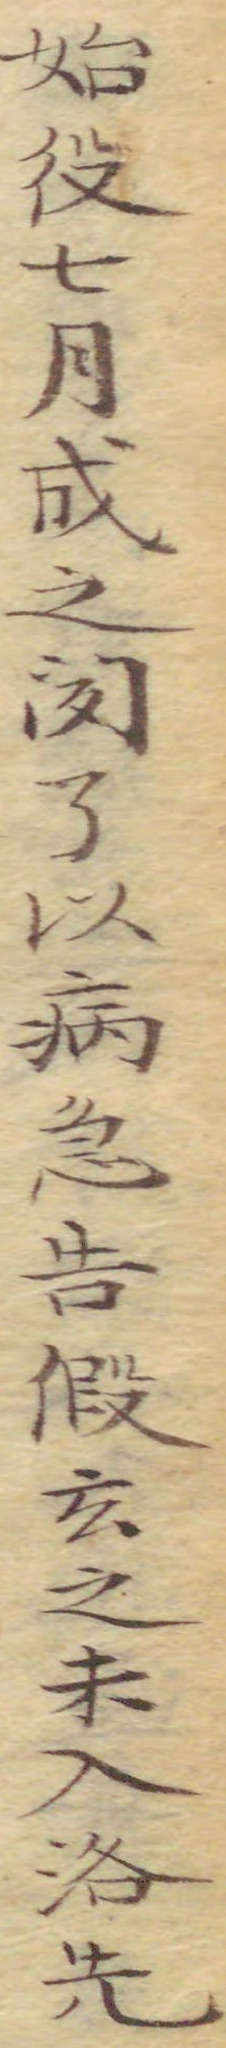始役七月成之聞了以病急告仮玄之未入洛先
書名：鶯宿雑記. 巻263-264
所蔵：国立国会図書館 National Diet Library, JAPAN
